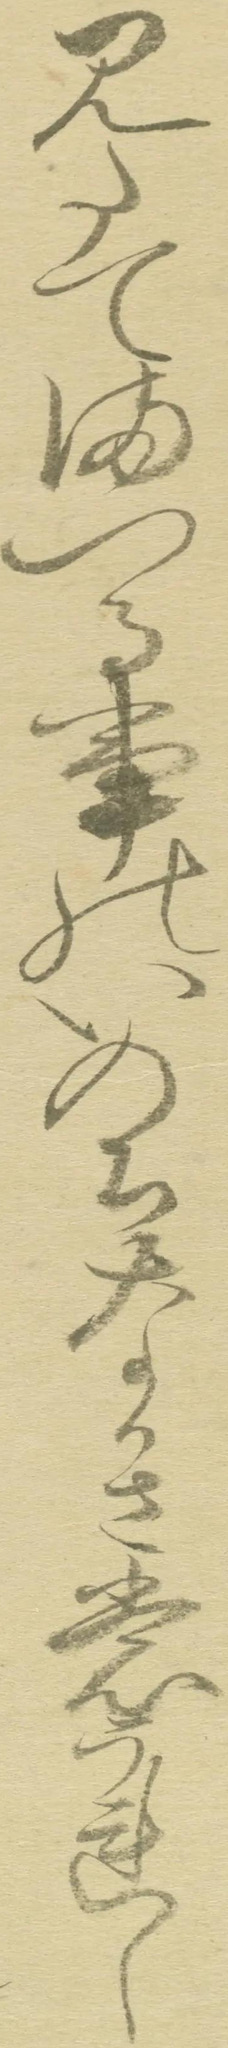みたてまつる事のいのちなかさもうれし
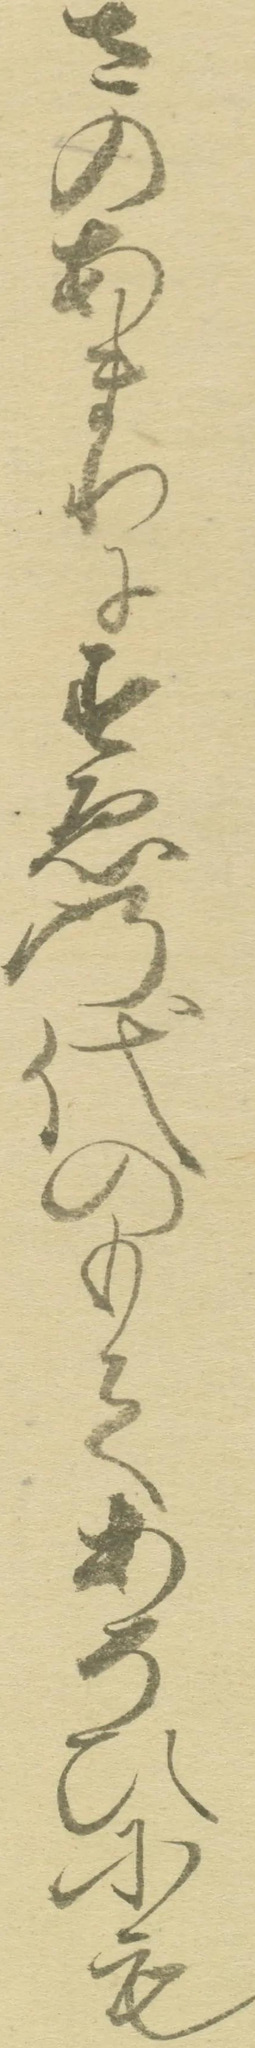さのあまりにすゑの代のもてあそひにも
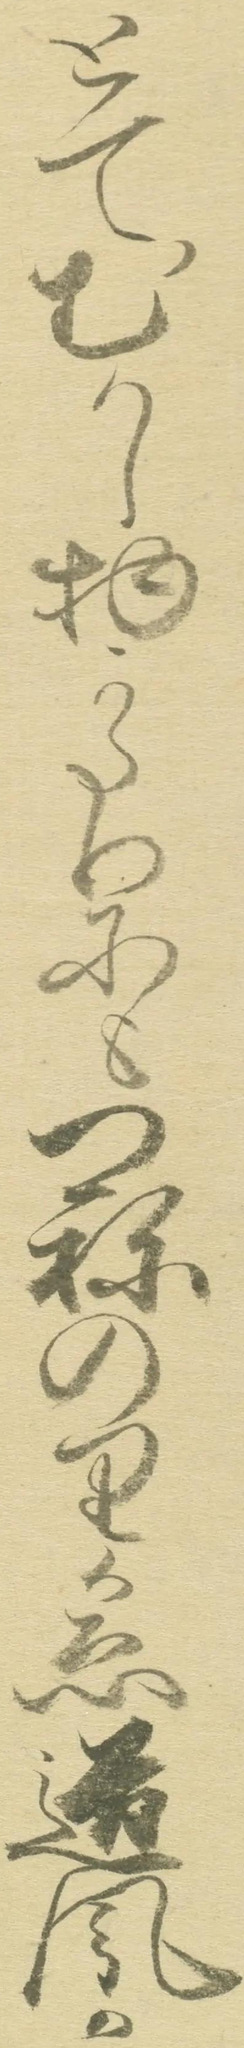とてむかし物かたりにもつねのりかゑ道風か
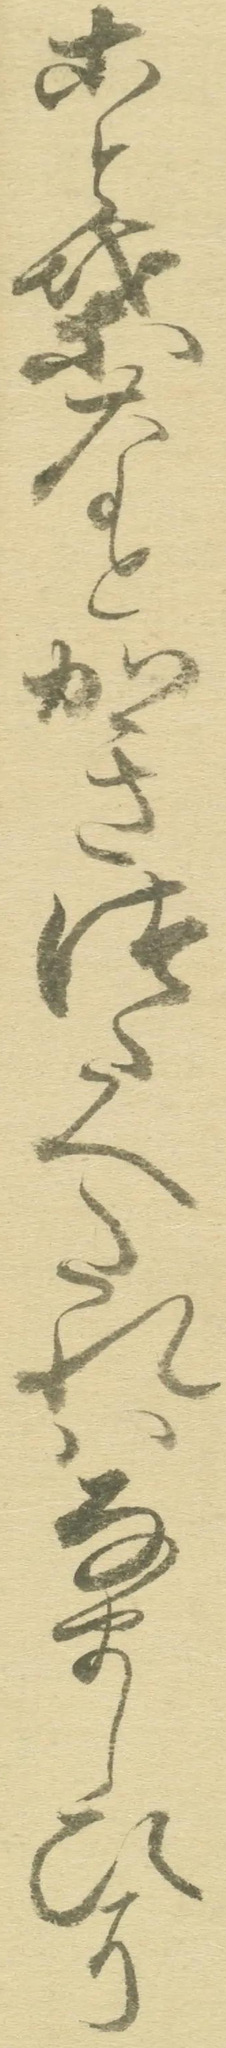こと葉なとかきつたへたれはなましひに
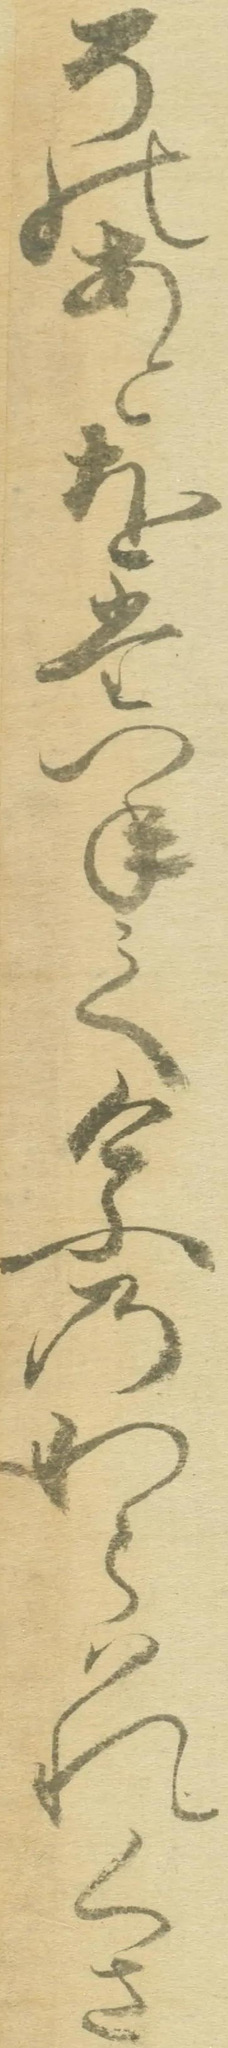そのあとをたつねてけふのわらはれくさ
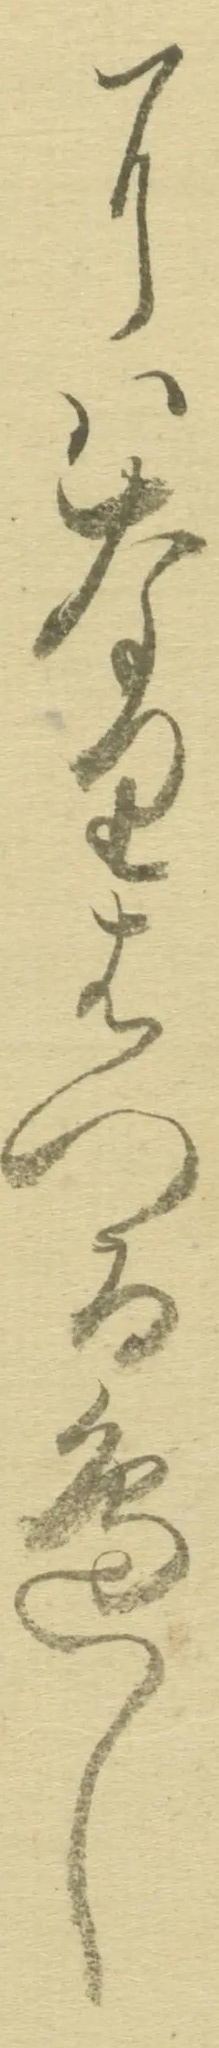にはなりはつるへし

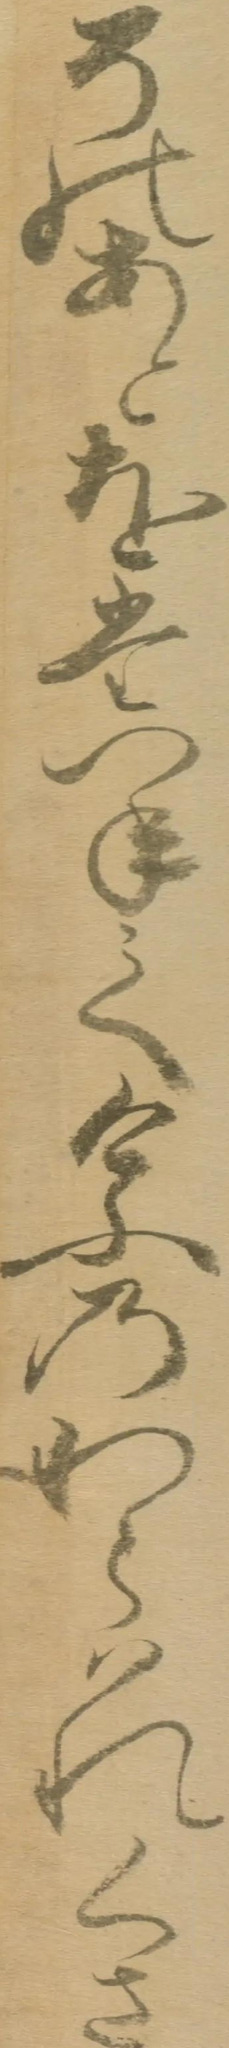そのあとをたつねてけふのわらはれくさ
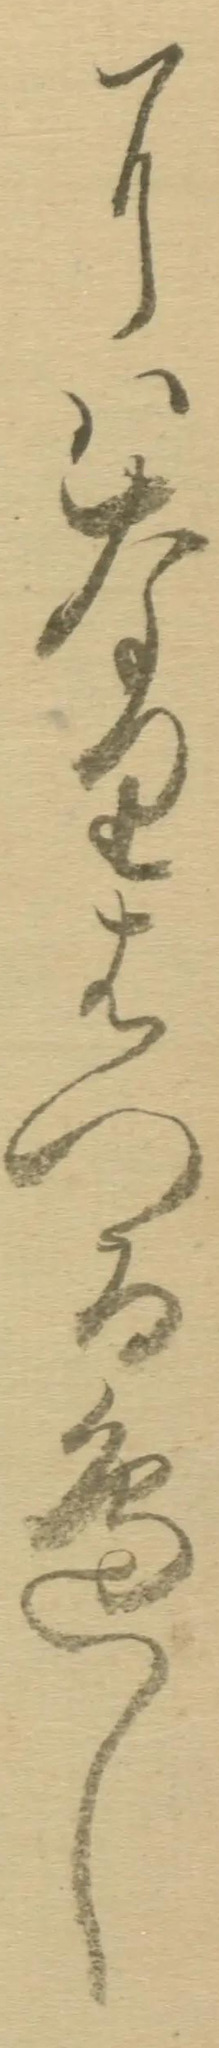にはなりはへるへし

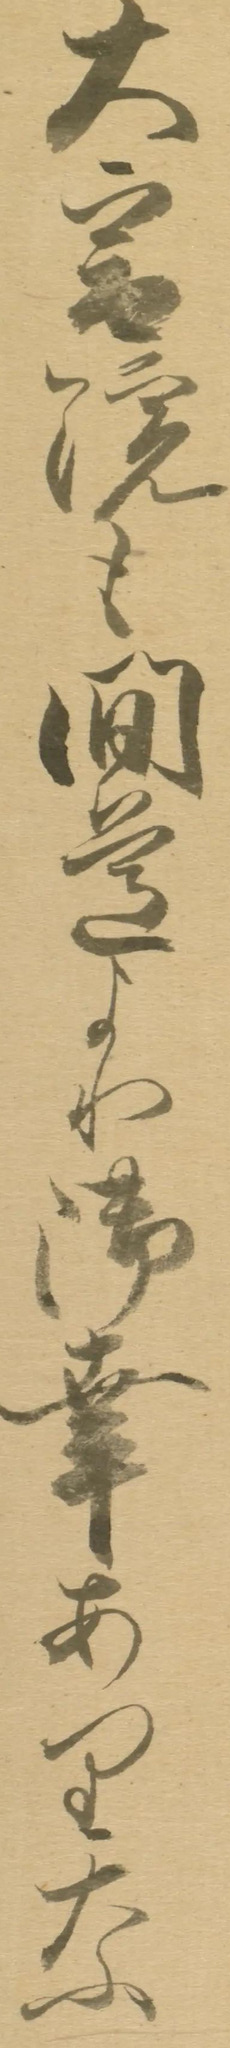大宮院も間道より御幸ありな

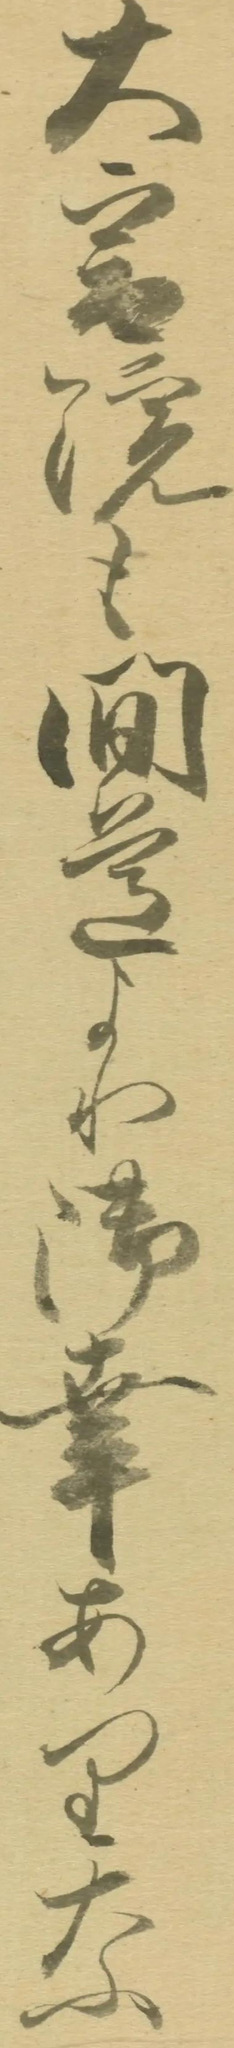大宮院も間道より御幸ありな
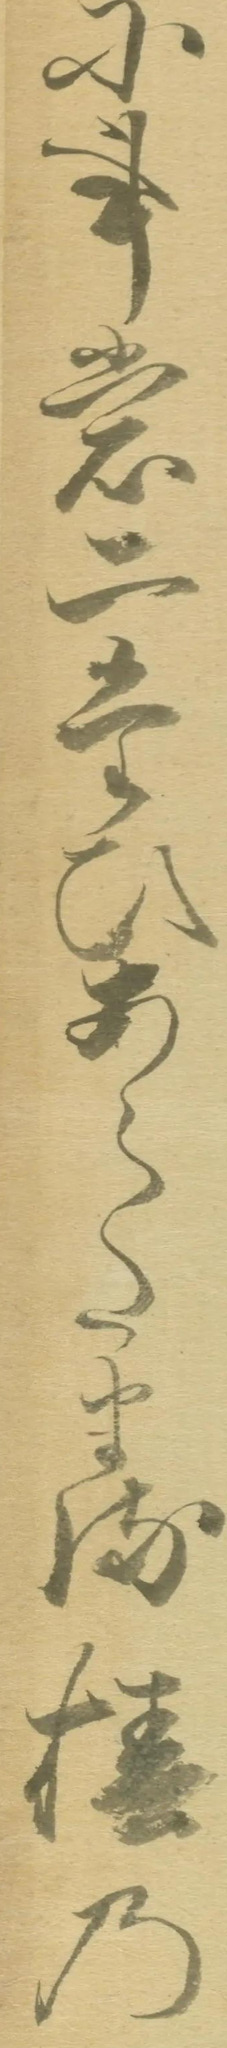に事も二たひあらたまる椿の
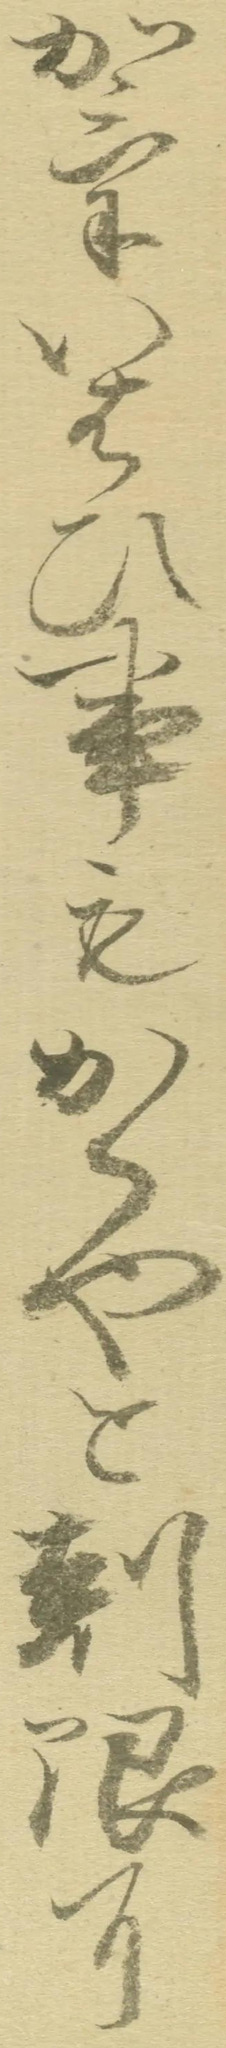かけいはひ事もかくやと刻限に
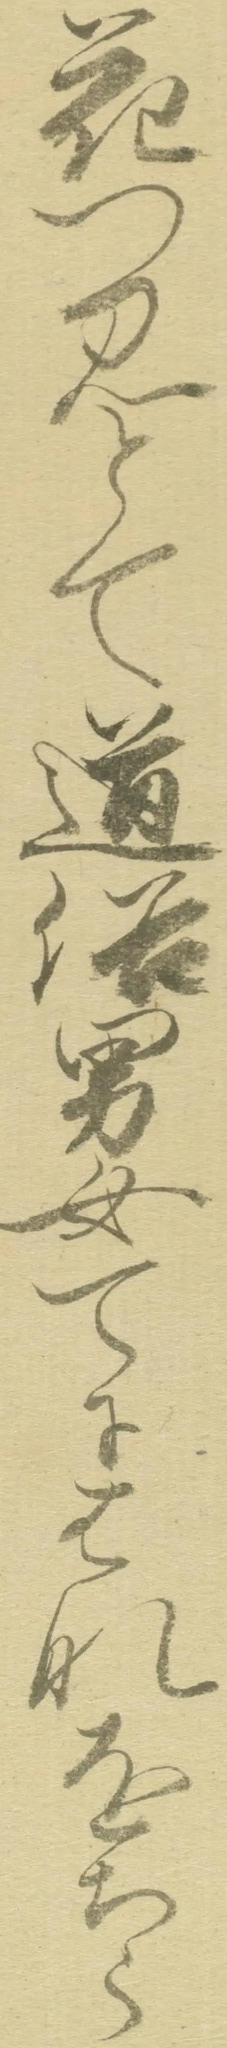花つみとて道俗男女てにはなをちら
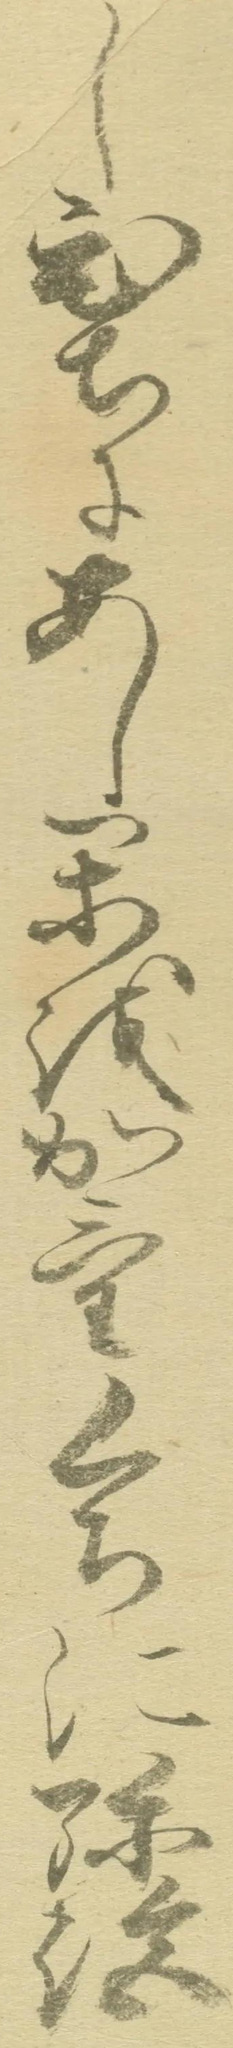しひちにあしかをかけくちに弥陀
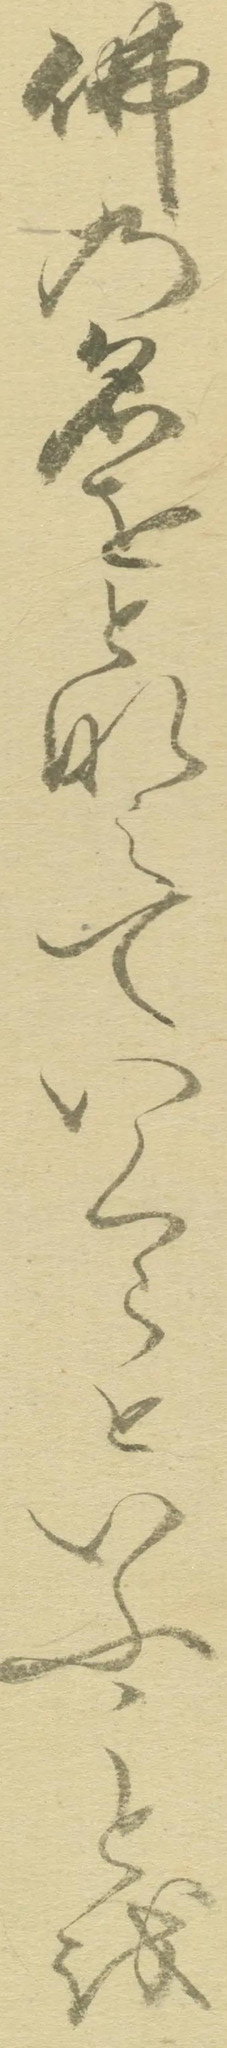仏の名をとなえていくらといふことを
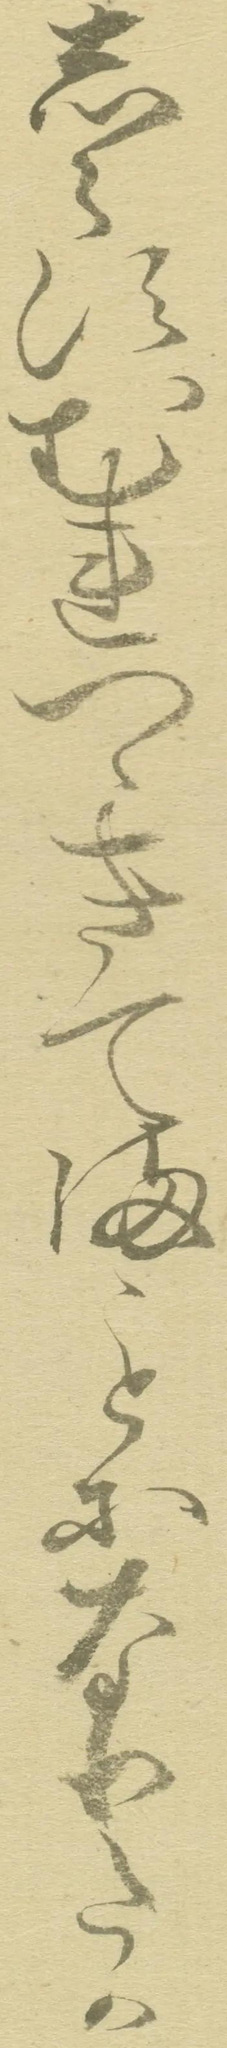しらすむれつゝきてまことになりたか
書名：賀茂祭縁起
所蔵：国立国会図書館 National Diet Library, JAPAN
